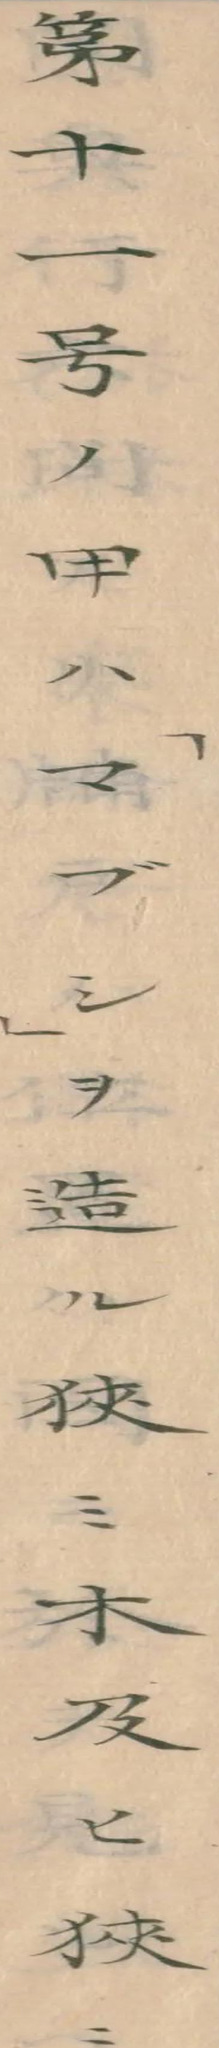第十一号ノ甲ハ「マブシ」ヲ造ル狭ミ木及ヒ狭ミ
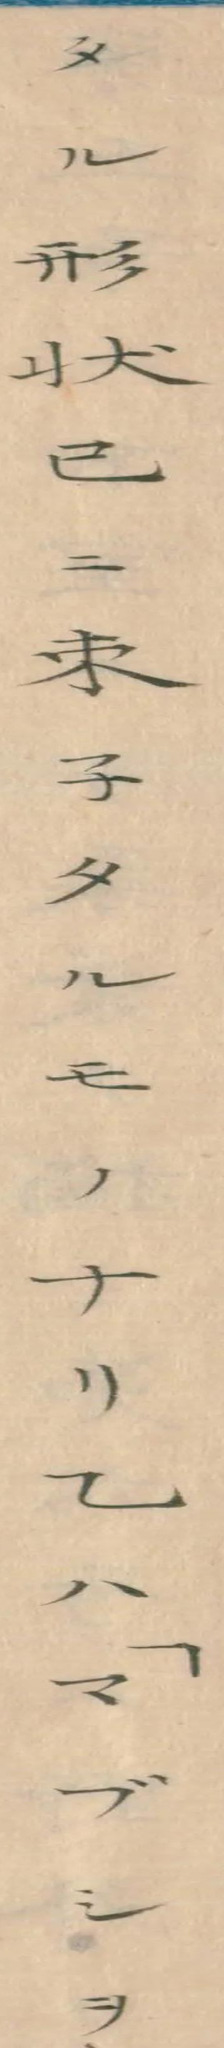タル形状已ニ束子タルモノナリ乙ハ「マブシヲ
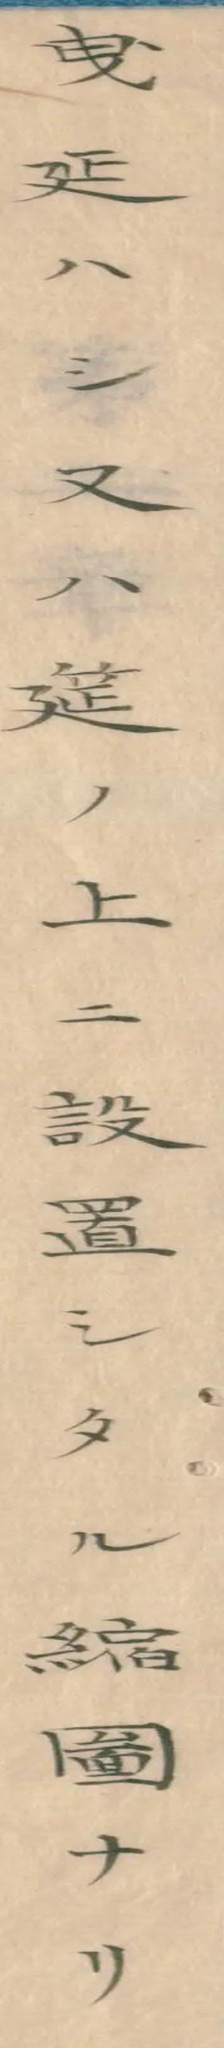曳延ハシ又ハ筵ノ上ニ設置シタル縮図ナリ

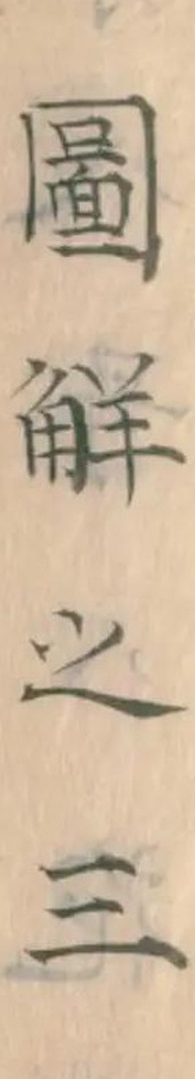図解之三
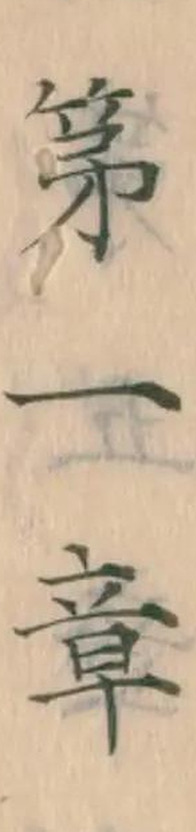第一章
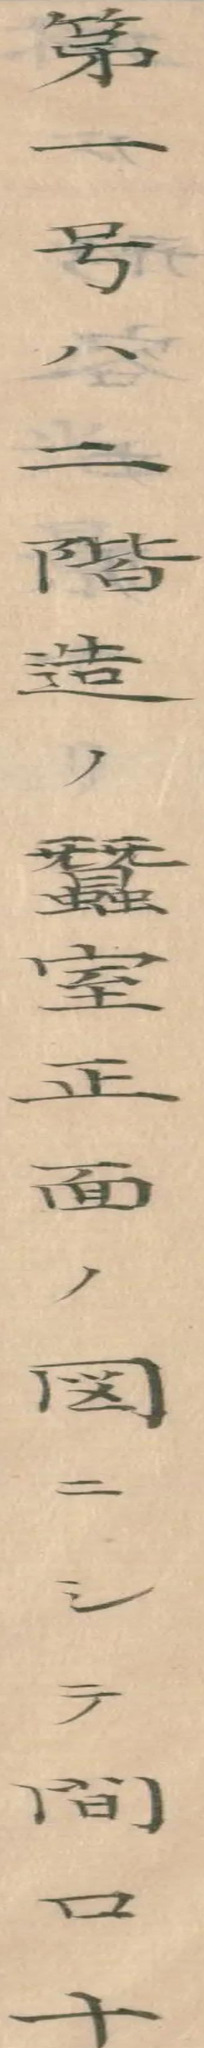第一号ハ二階造ノ蚕室正面ノ図ニシテ間口十
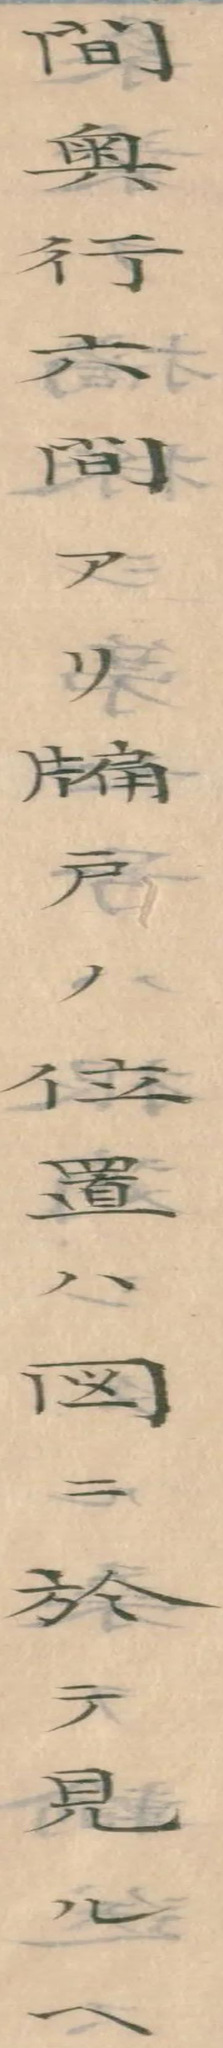間奥行六間アリ牑戸ノ位置ハ図ニ於テ見ルヘ
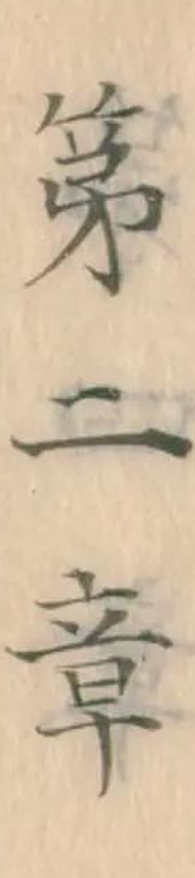第二章
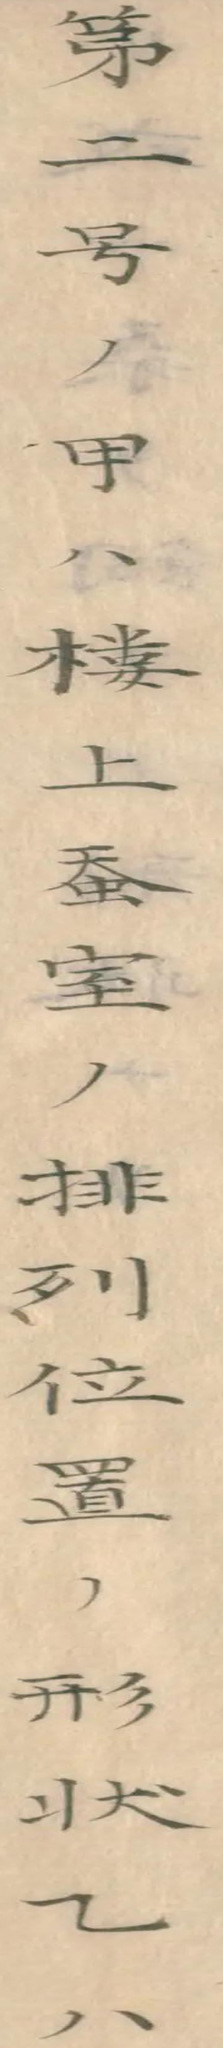第二号ノ甲ハ楼上蚕室ノ排列位置ノ形状乙ハ
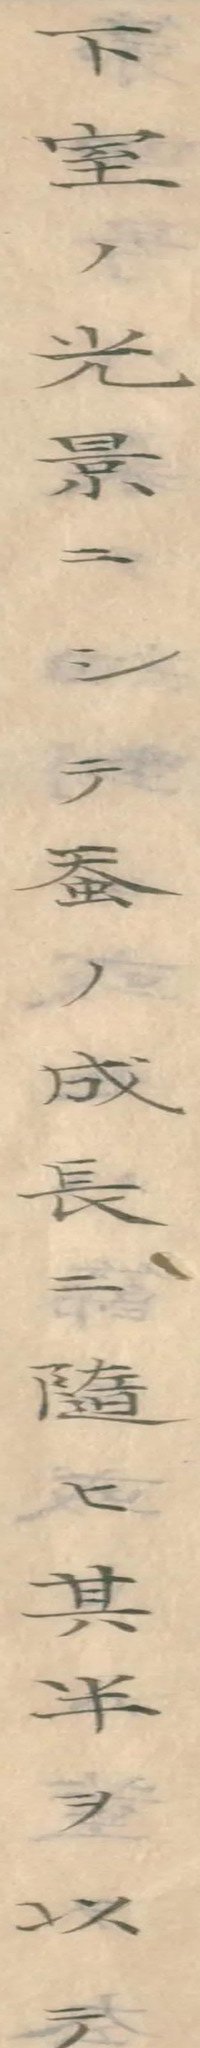下室ノ光景ニシテ蚕ノ成長ニ随ヒ其半ヲ以テ
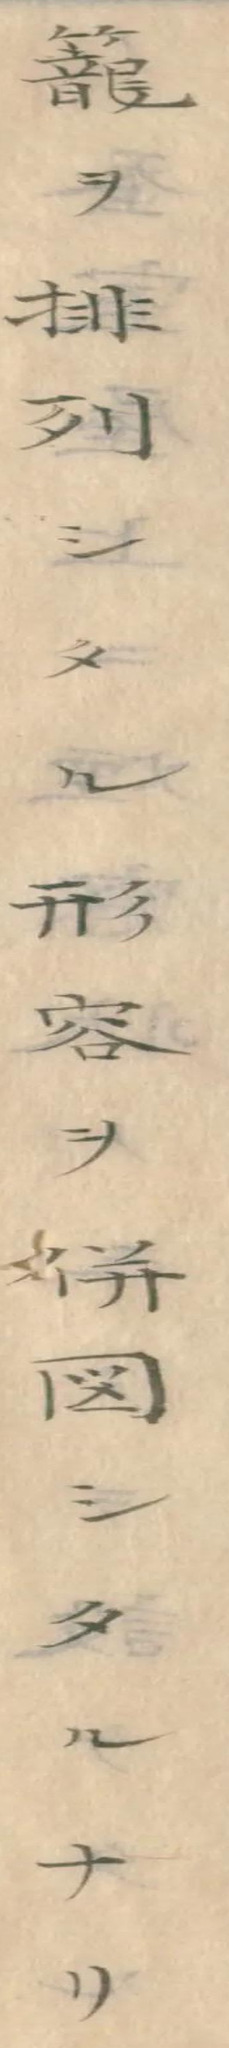籠ヲ排列シタル形容ヲ併図シタルナリ
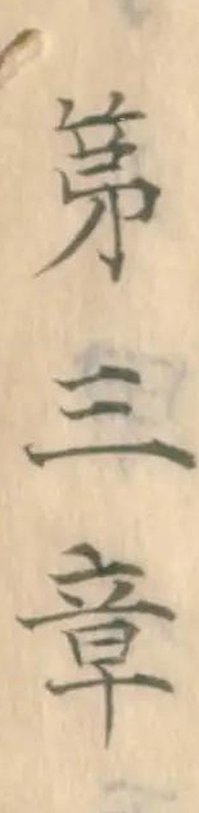第三章

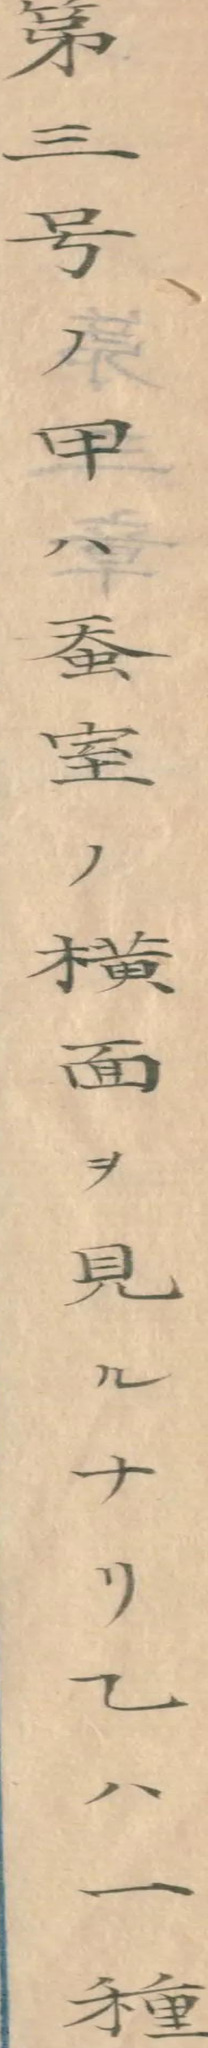第三号ノ甲ハ蚕室ノ横面ヲ見ルナリ乙ハ一種
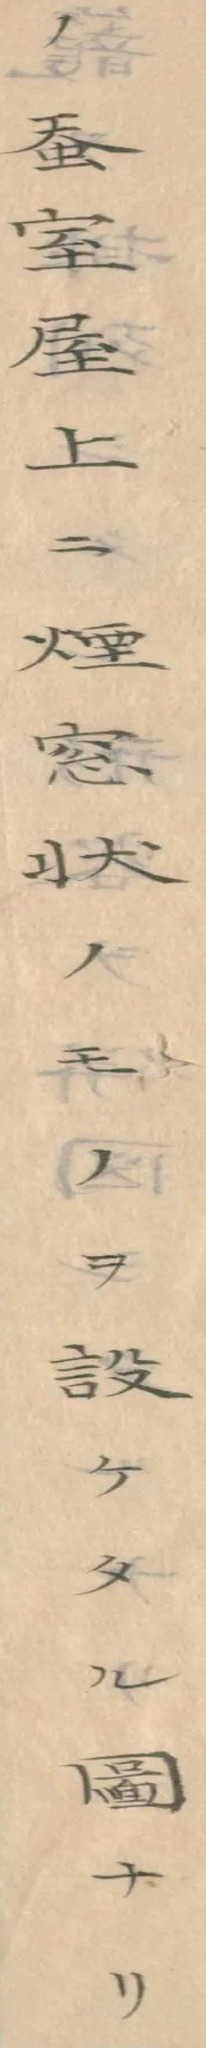ノ蚕室屋上ニ煙窓状ノモノヲ設ケタル図ナリ
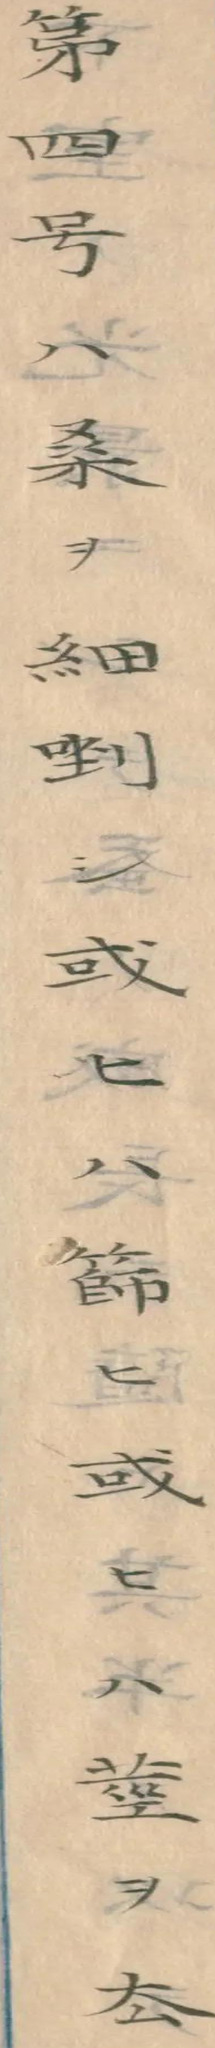第四号ハ桑ヲ細剉シ或ヒハ篩ヒ或ヒハ茎ヲ去
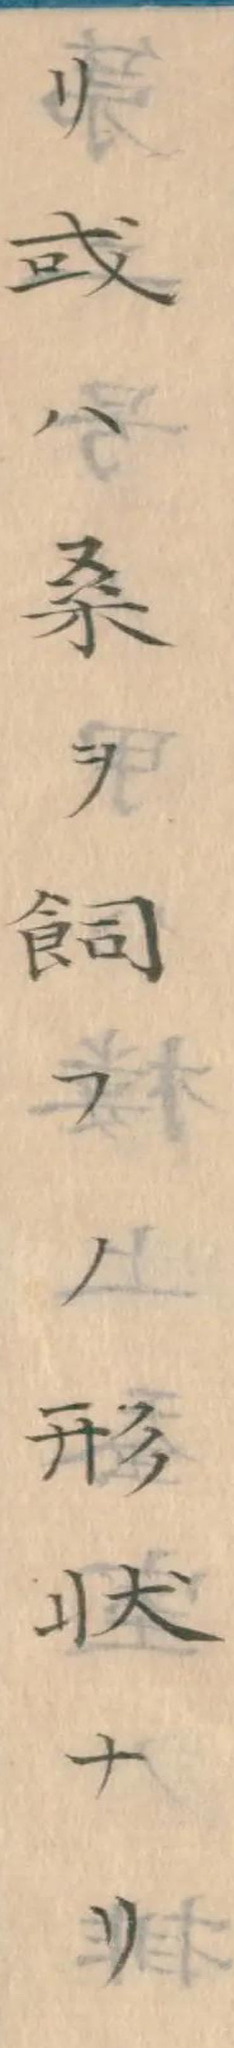リ或ハ桑ヲ飼フノ形状ナリ
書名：蚕桑集成
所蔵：国立国会図書館 National Diet Library, JAPAN
